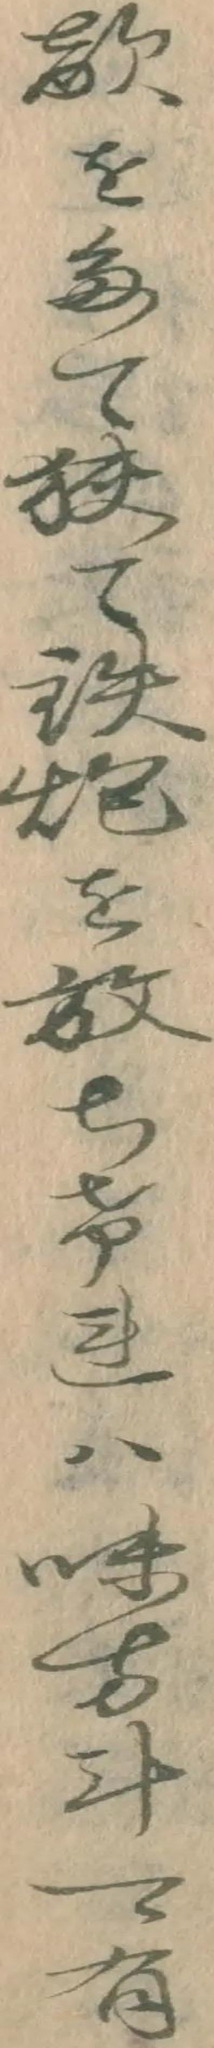敵を多て狭て鉄炮を放ち希連は味方斗可有

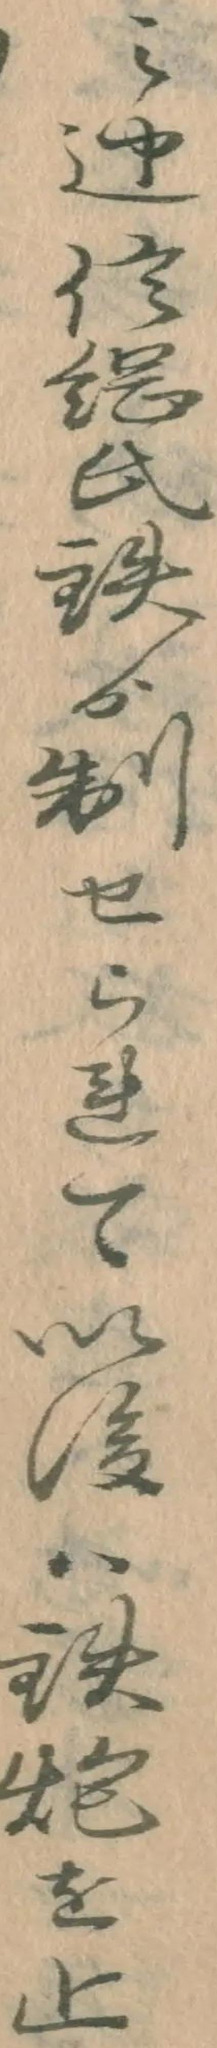之迚信綱氏鉄ゟ制せら連て以後は鉄炮を止
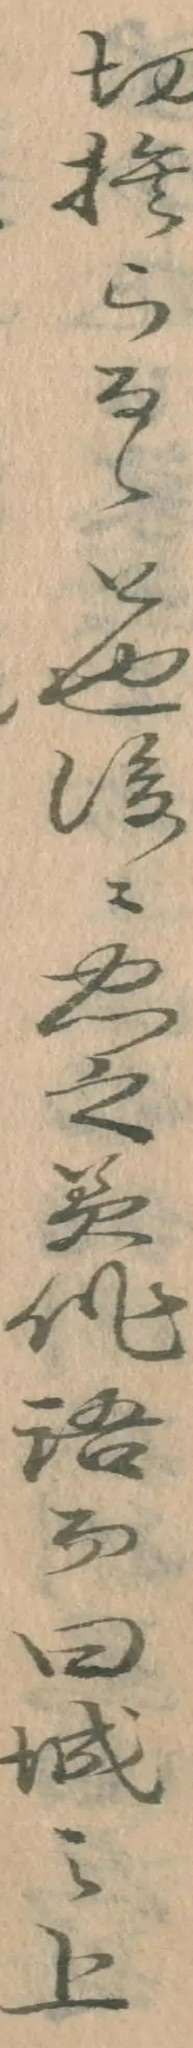切捨らるゝと也後に忠之美作語而曰城之上
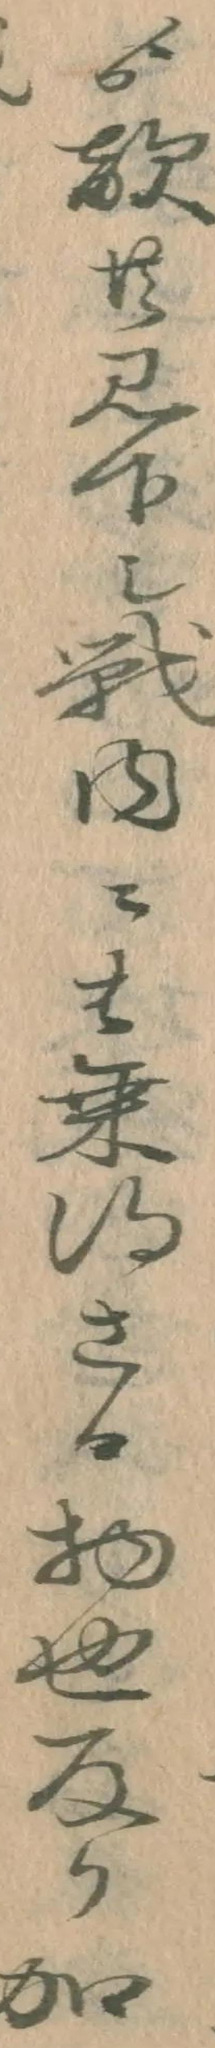ゟ敵共見下し戦内に者乗得さる物也反り加
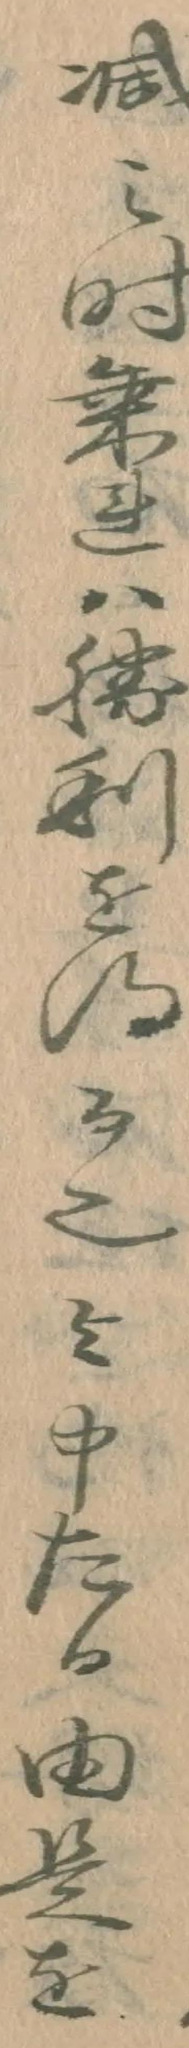減之時乗連は勝利を得る也与申たる由是を
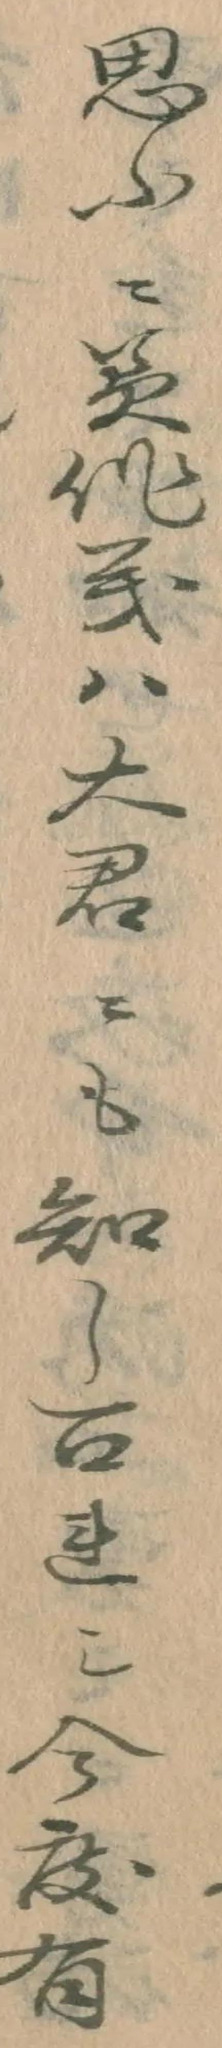思ふに美作義は大君にも知し召連し今度有
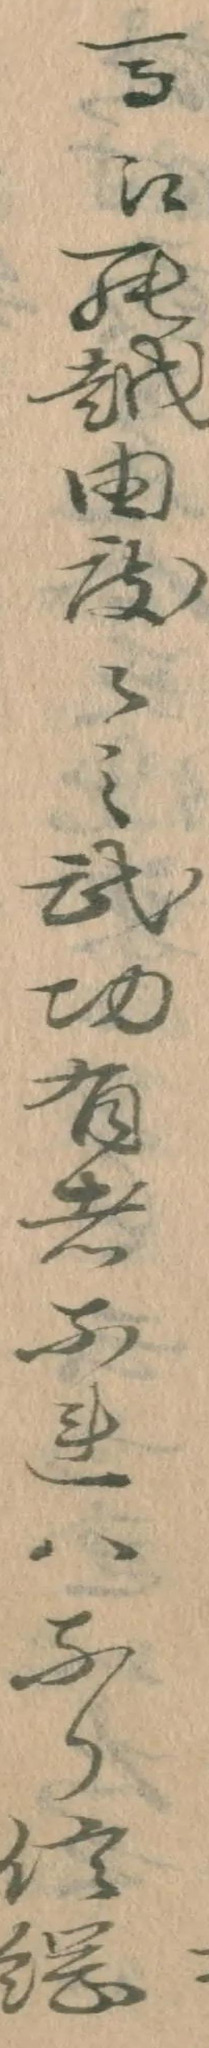馬江罷越由度々之武功有者な連はなり信綱
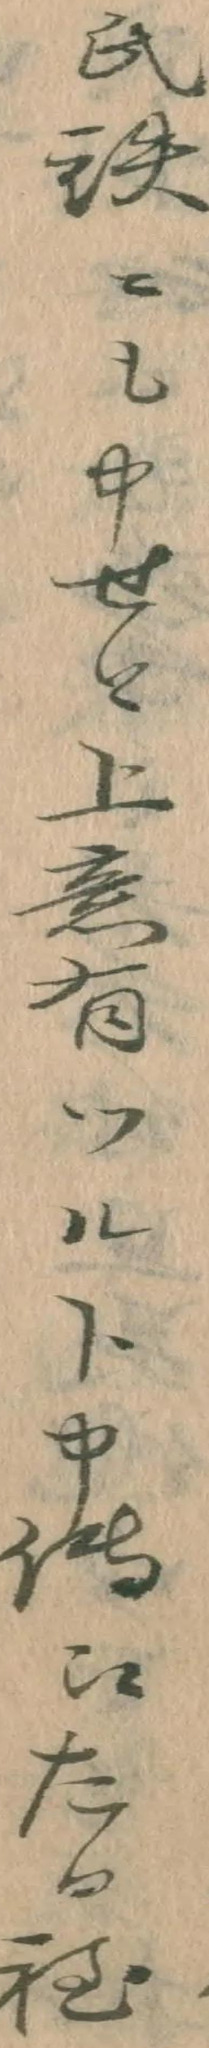氏鉄にも申せと上意有つると申伝江たる程
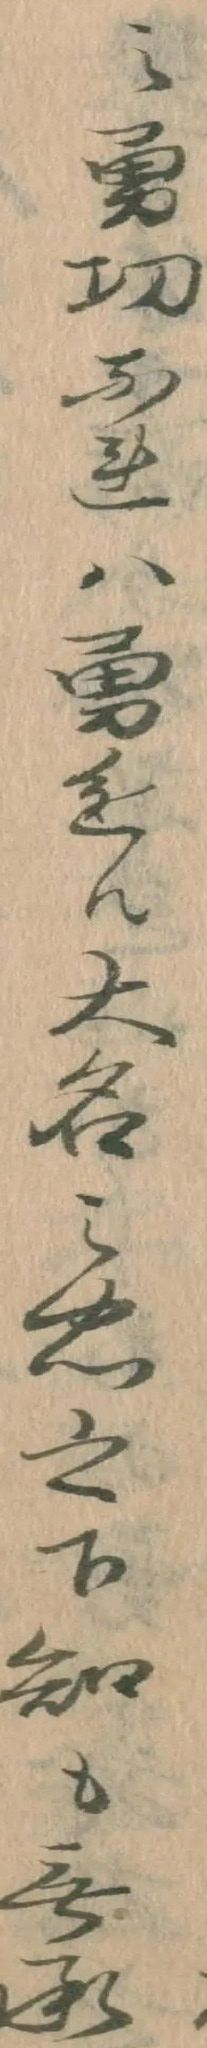之勇功な連は勇進る大名之忠之下知も無承
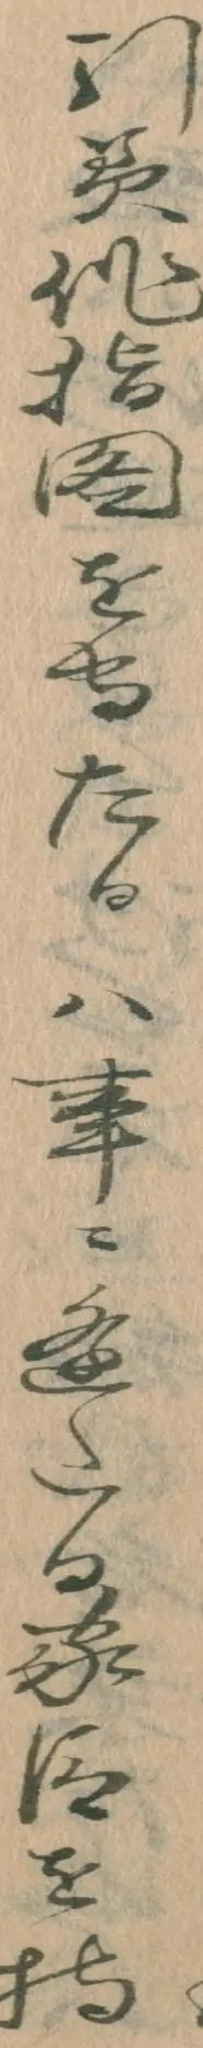引美作指図を守たるは事に逢たる家臣を持
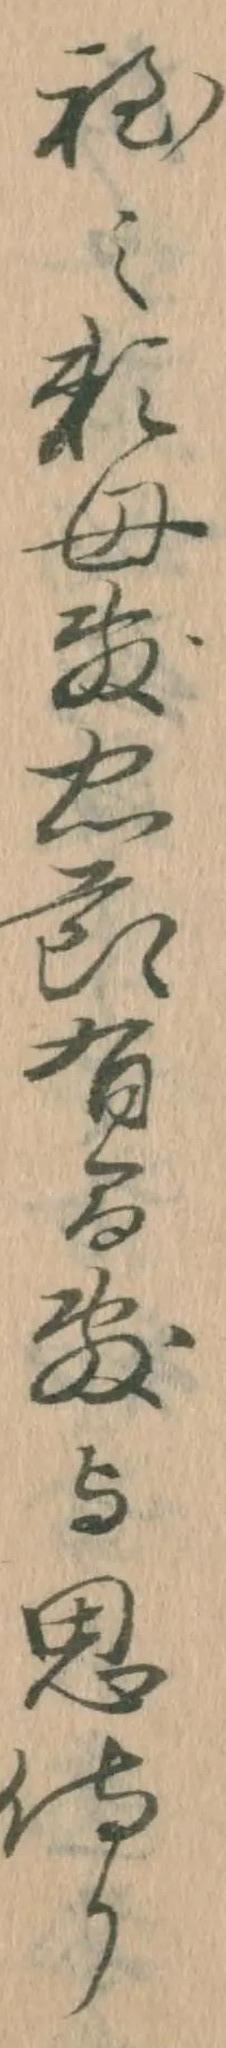程之頼母敷忠節有間敷与思侍り
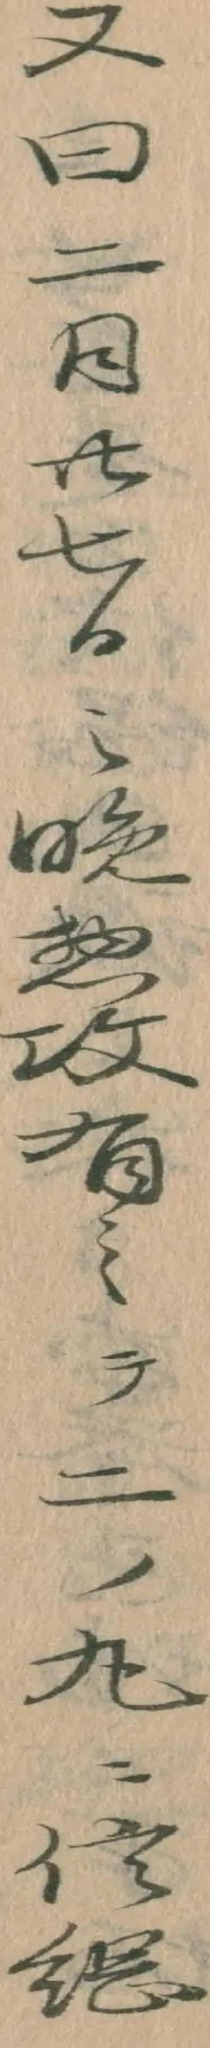又曰二月廿七日之晩惣攻有之て二之丸に信綱
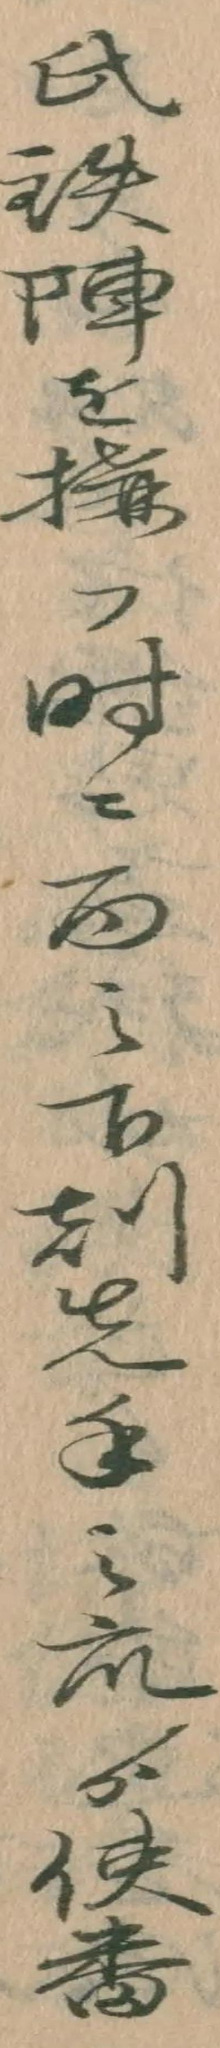氏鉄陣を構ふ時に酉之下刻先手之衆ゟ使番
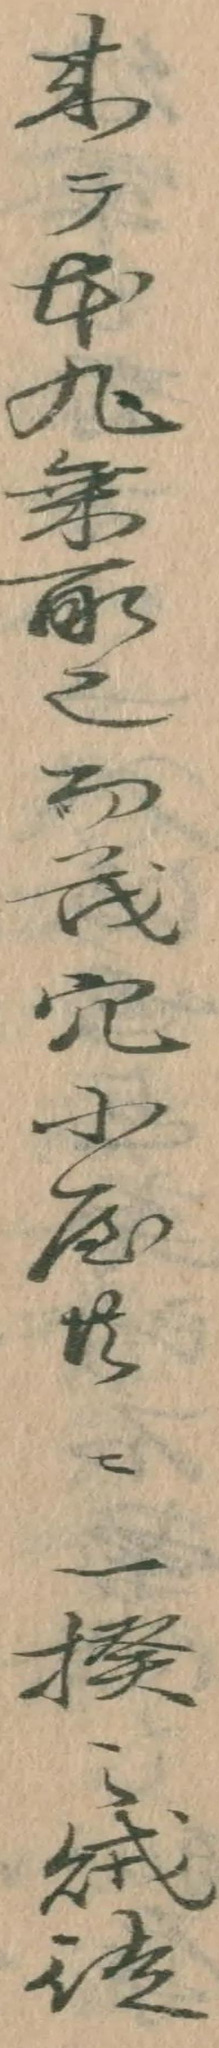来て本丸乗取也而茂穴小屋共に一揆之賊徒
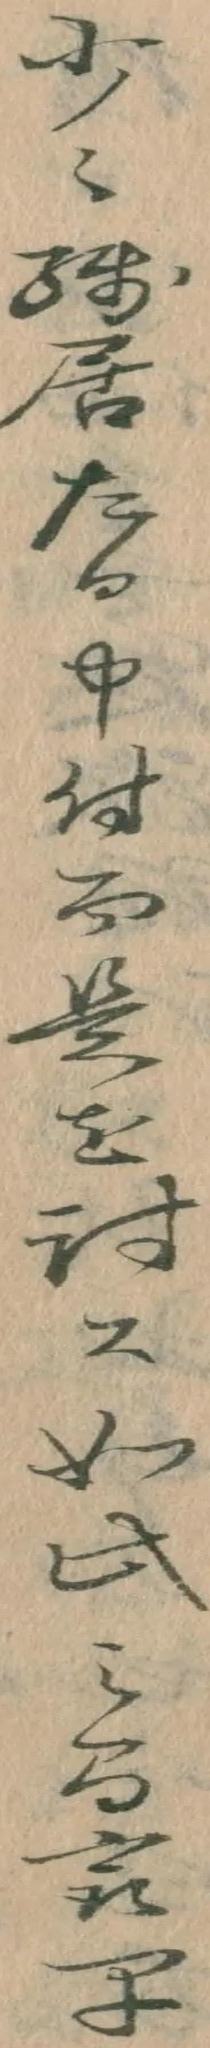少々残居たる申付而是を討す如此之間最早
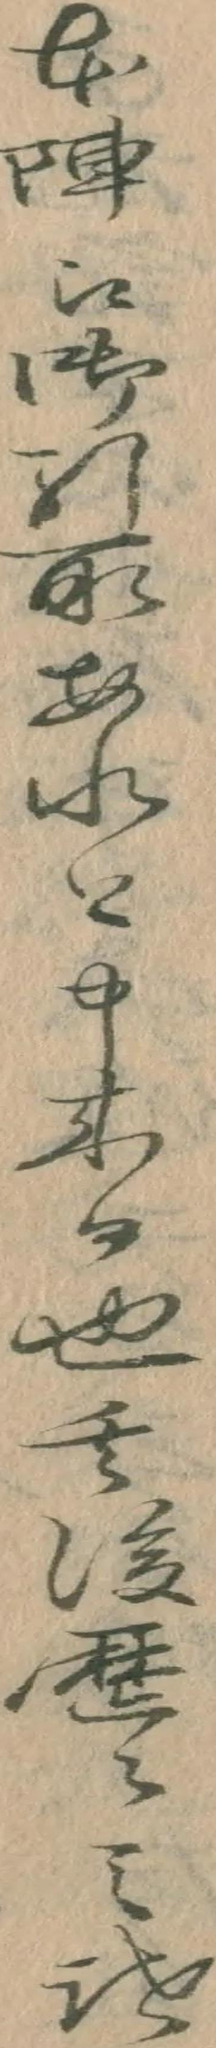本陣江御引取あれと申来る也其後歴々之諸
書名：切支丹御退治記 49巻. [7]
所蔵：国立国会図書館 National Diet Library, JAPAN
